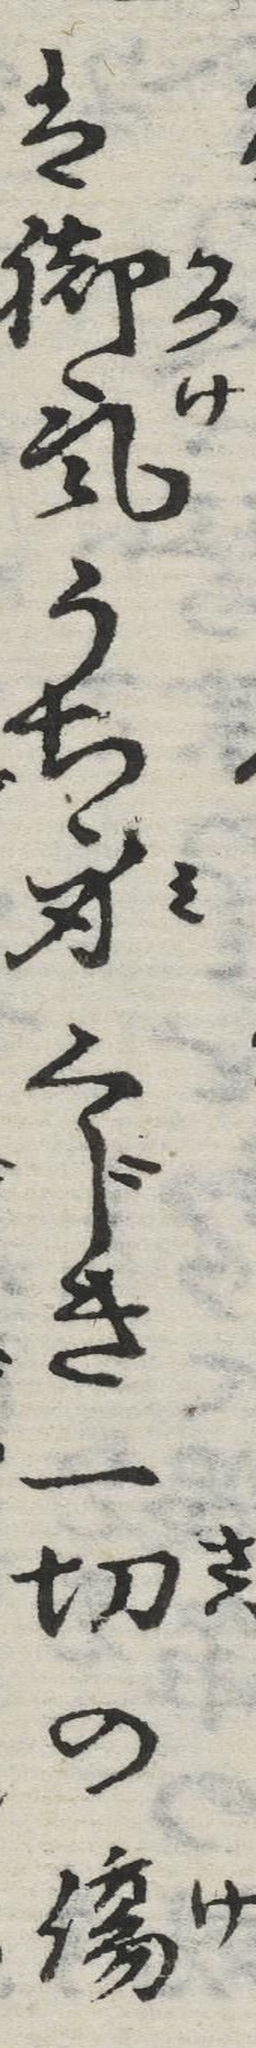は脚気うち身くじき一切の傷
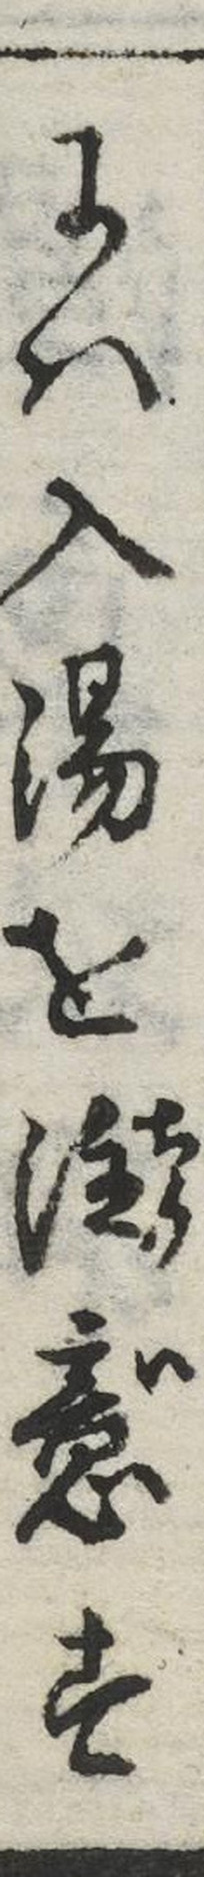にハ入湯を注意す
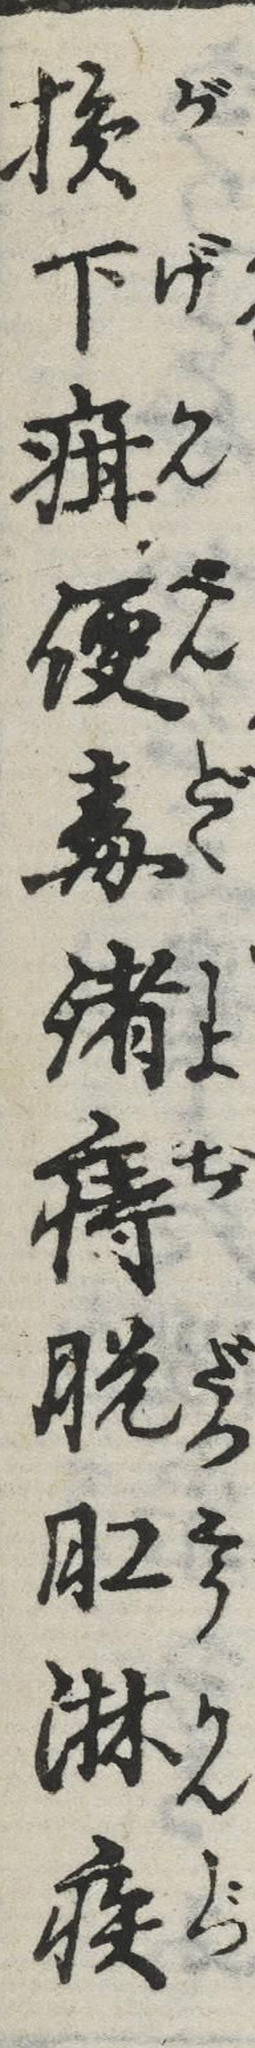損下疳便毒諸痔脱肛淋疾
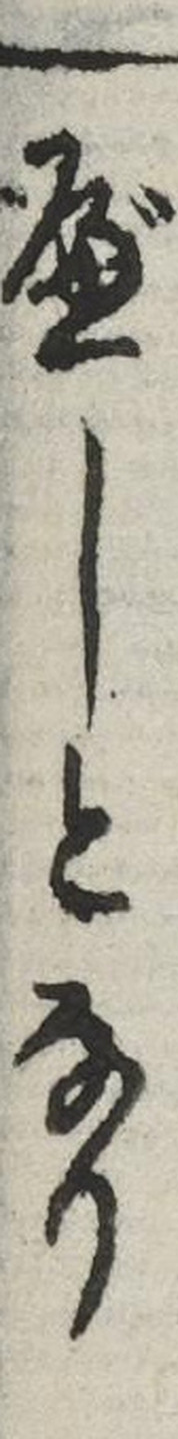べしとなり
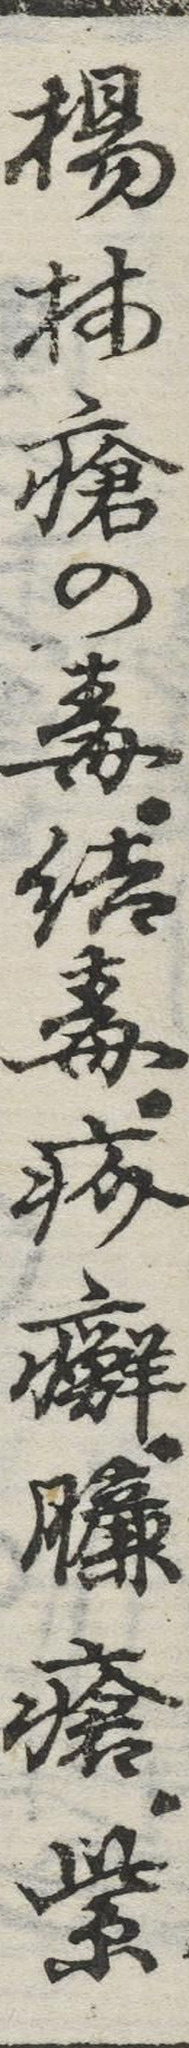楊梅瘡の毒。結毒。疥癬。臁瘡。紫
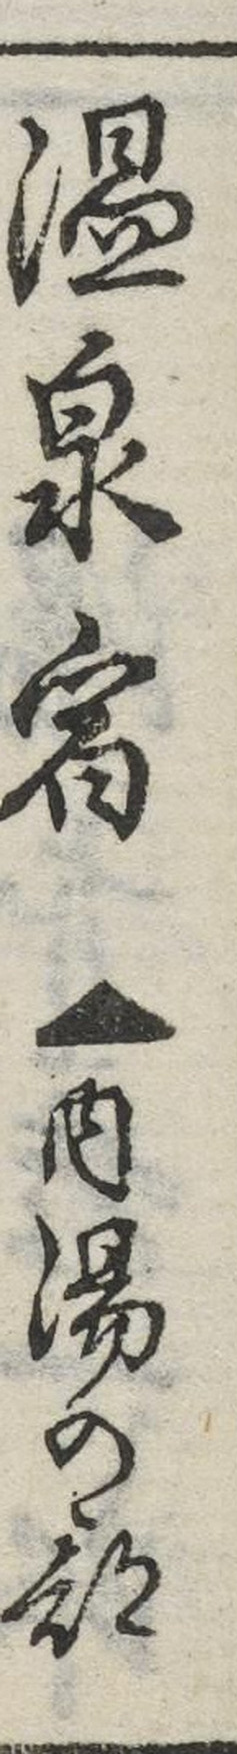温泉宿▲内湯の部
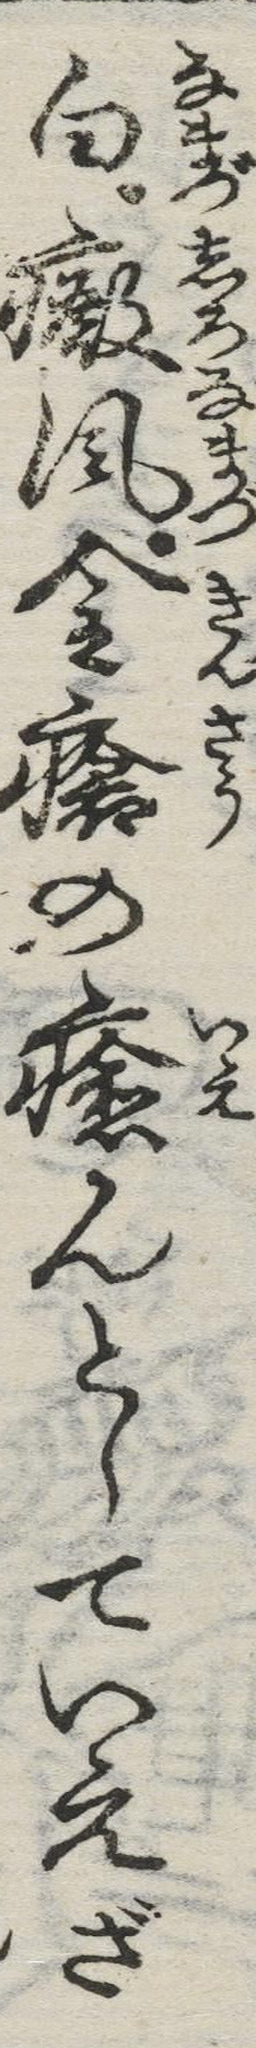白。癜風。金瘡の癒んとしていえざ
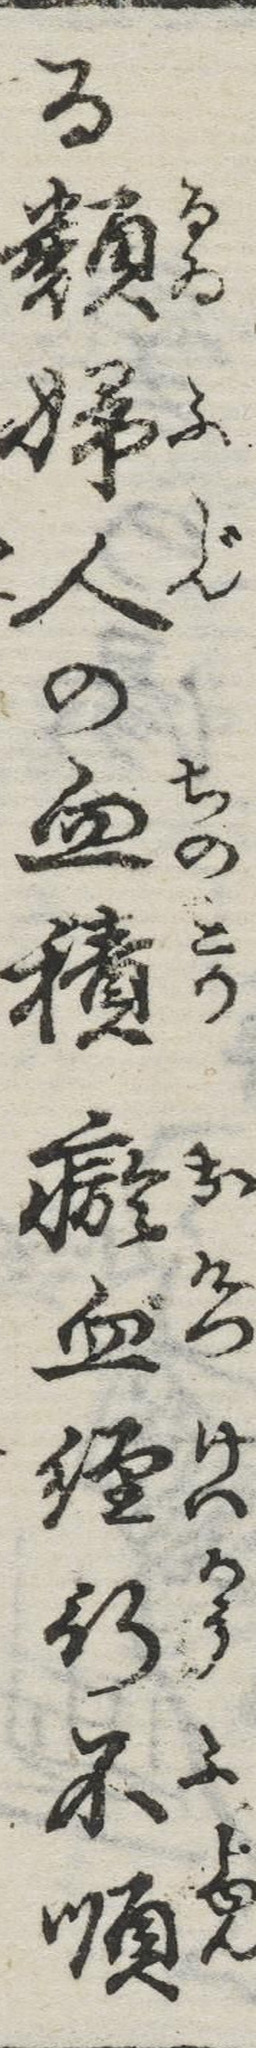る類婦人の血積瘀血経行不順
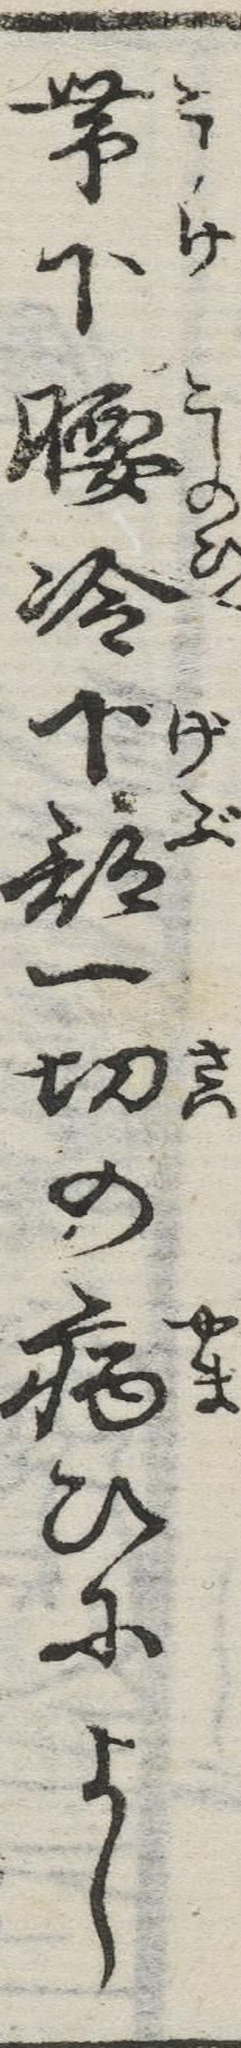帯下腰冷下部一切の病ひによし
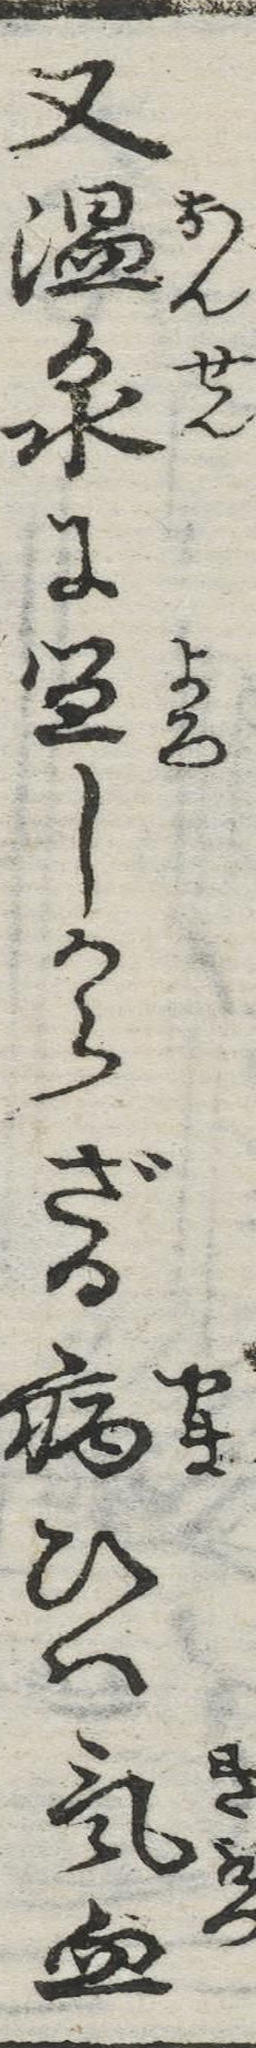又温泉に宜しからざる病ひは気血
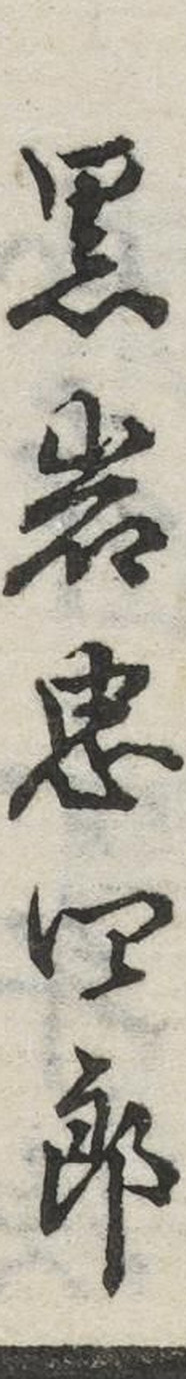黒岩忠四郎
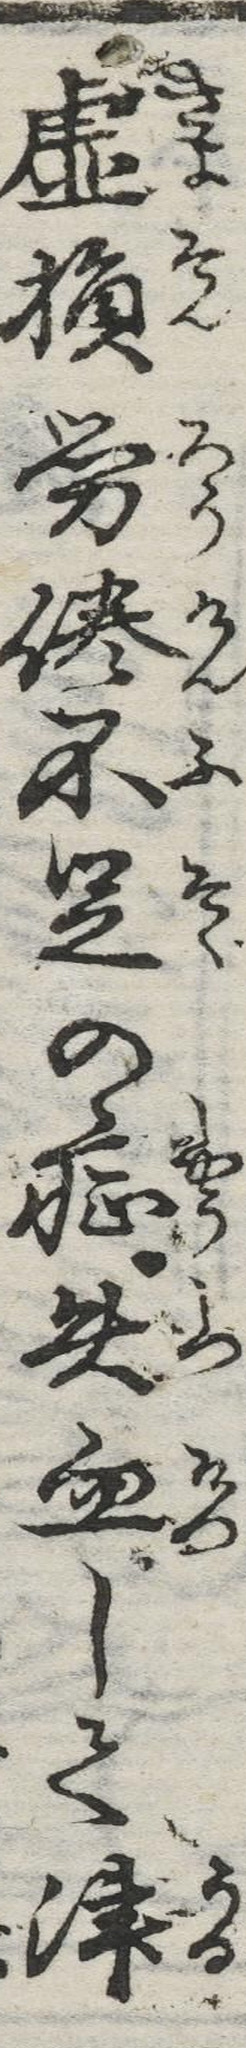虚損労倦不足の症。失血して津
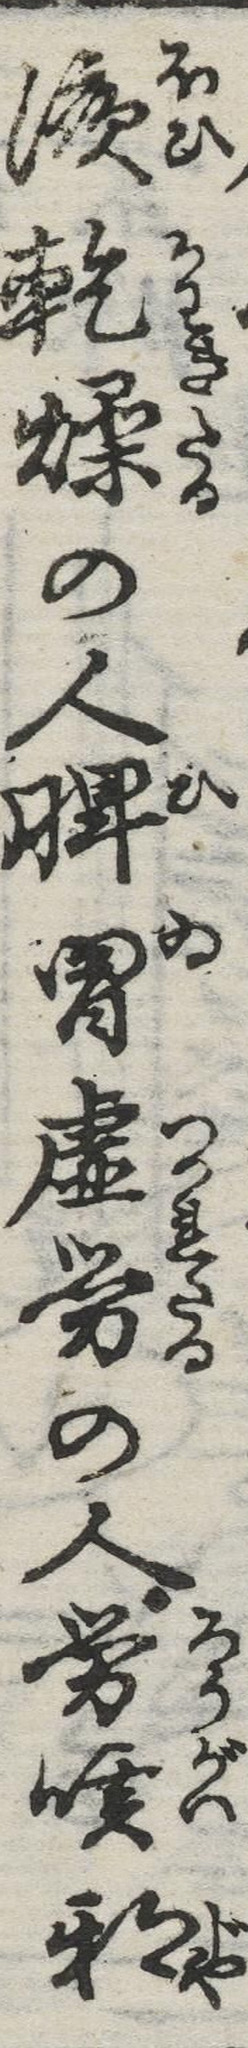液乾燥の人脾胃虚労の人。労咳邪
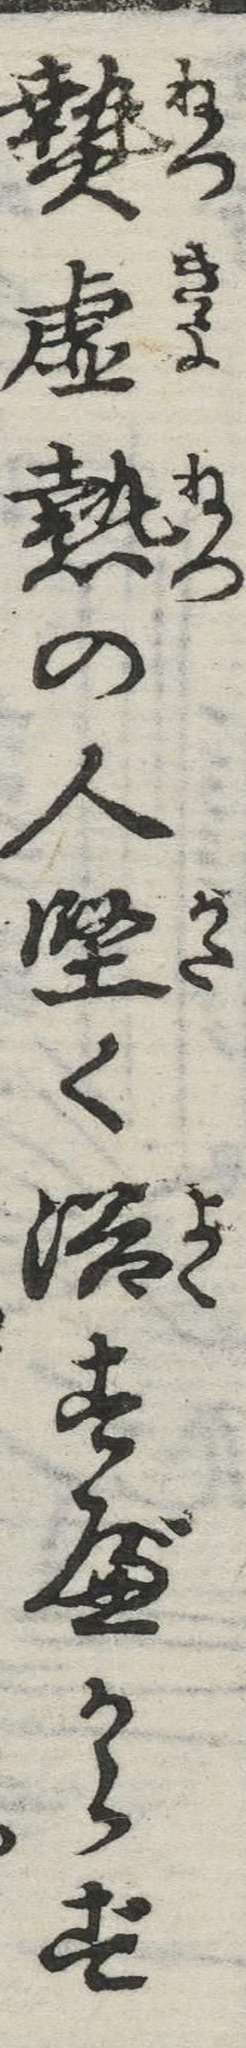熱虚熱の人堅く浴すべからず
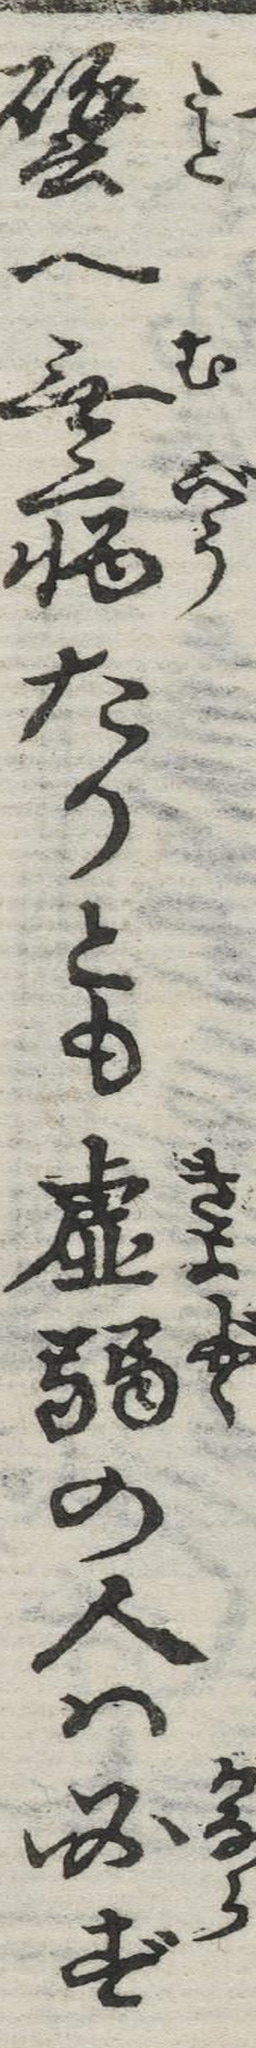譬へ無病たりとも虚弱の人ハ必ず
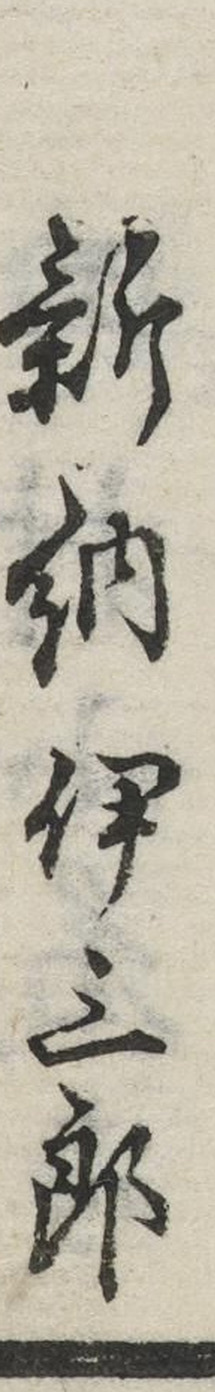新納伊三郎
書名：諸國温泉遊覽記　全
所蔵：東京大学地震研究所図書室 Earthquake Research Institute Library, The University of Tokyo, JAPAN
